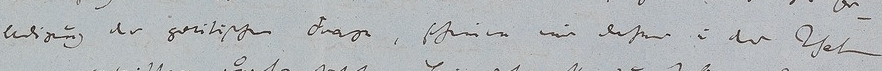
ledigung der politischen Frage, scheinen mir daher in der That
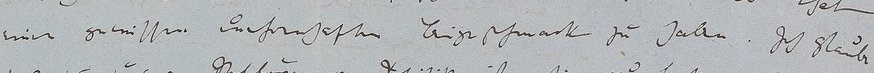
einen gewissen unehrenhaften Beigeschmack zu haben. Ich glaube,
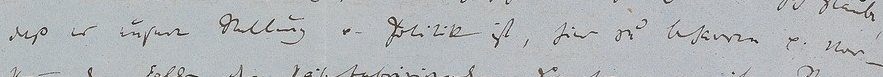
daß es unsere Stellung &. Politik ist, hier zu beharren &. vor-
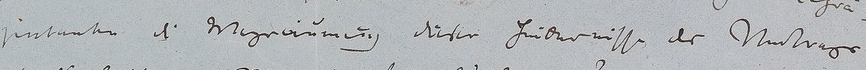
sentanten die Wegräumung dieser Hindernisse des Vertrags
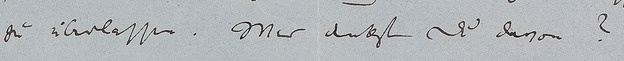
zu überlassen. Was denkst Du davon?
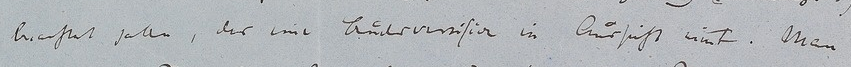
beachtet haben, das eine Bundesrevision in Aussicht nimmt. Man
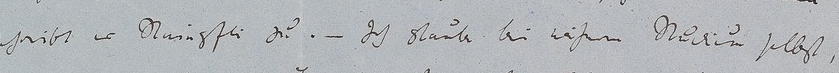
schreibt es Stämpfli zu. – Ich glaube bei näherm Studium selbst,
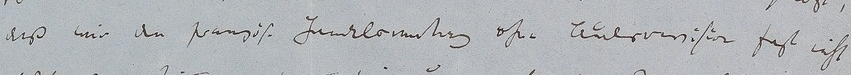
daß wir den französ. Handelsvertrag ohne Bundesrevision fast nicht
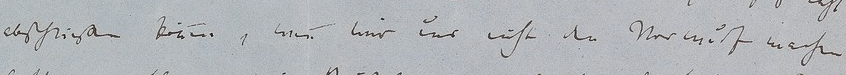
abschließen können, wenn wir uns nicht den Vorwurf machen
